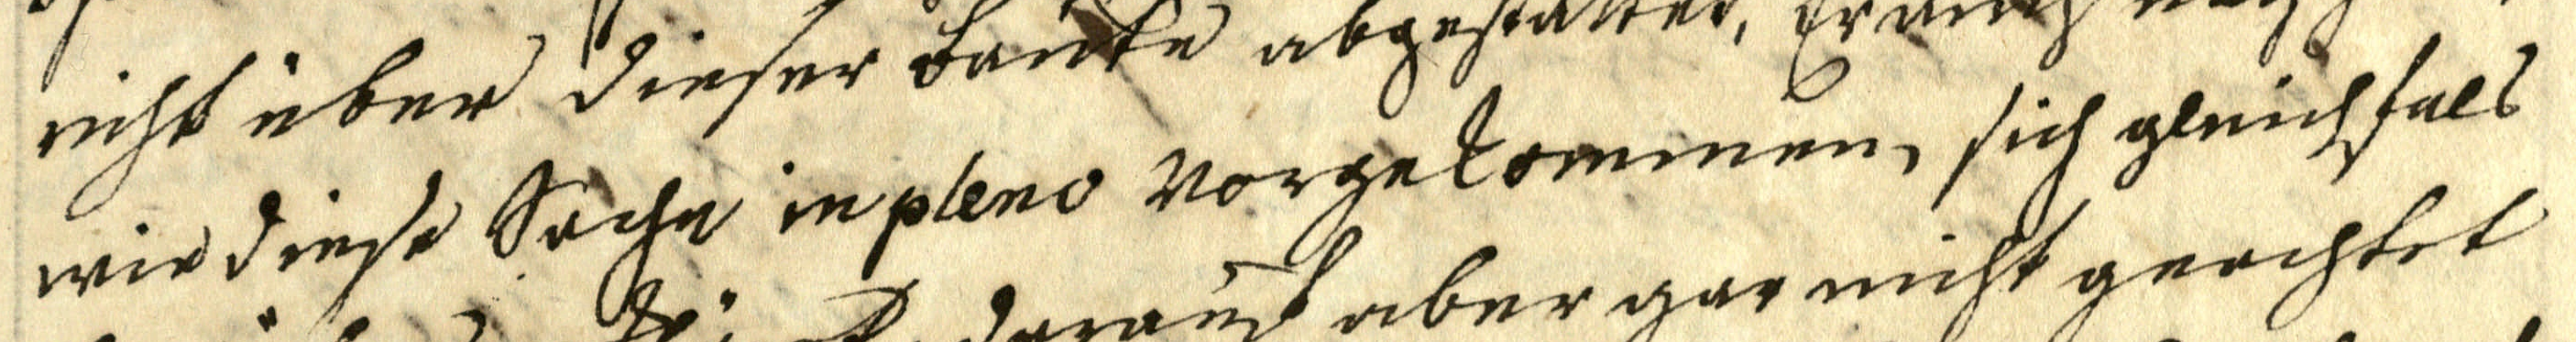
wie diese Sache in pleno vorgekommen, sich gleichfals
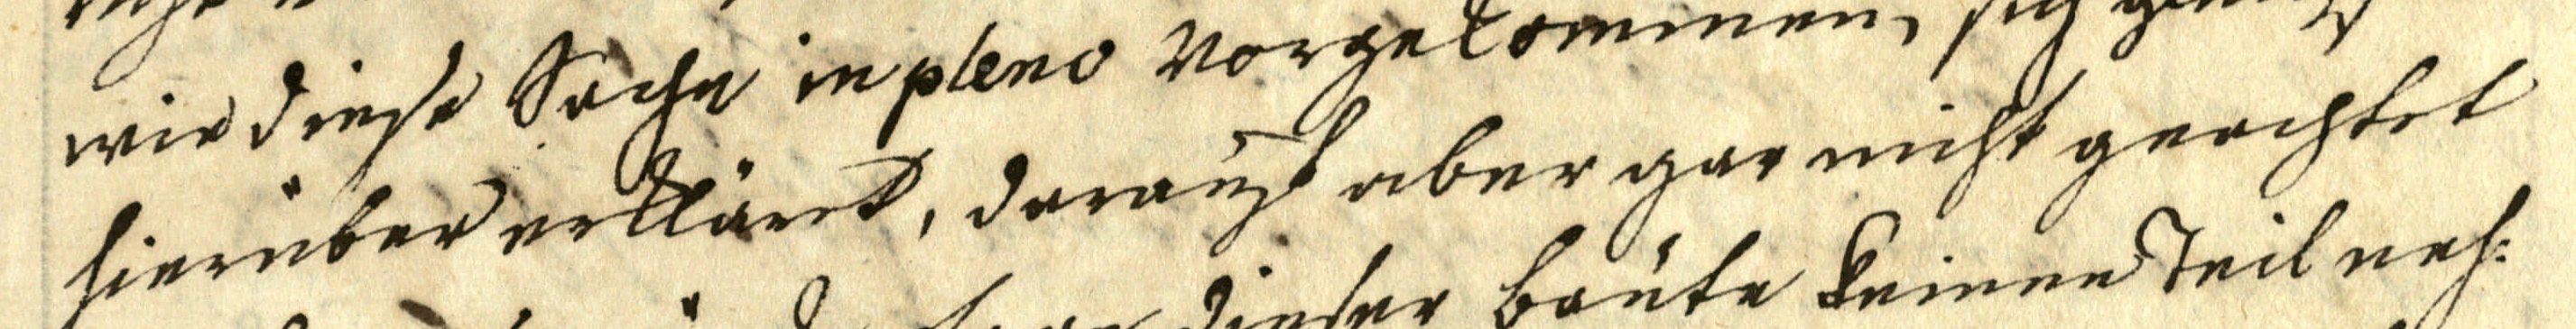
hierüber erkläret, darauf aber gar nicht geachtet
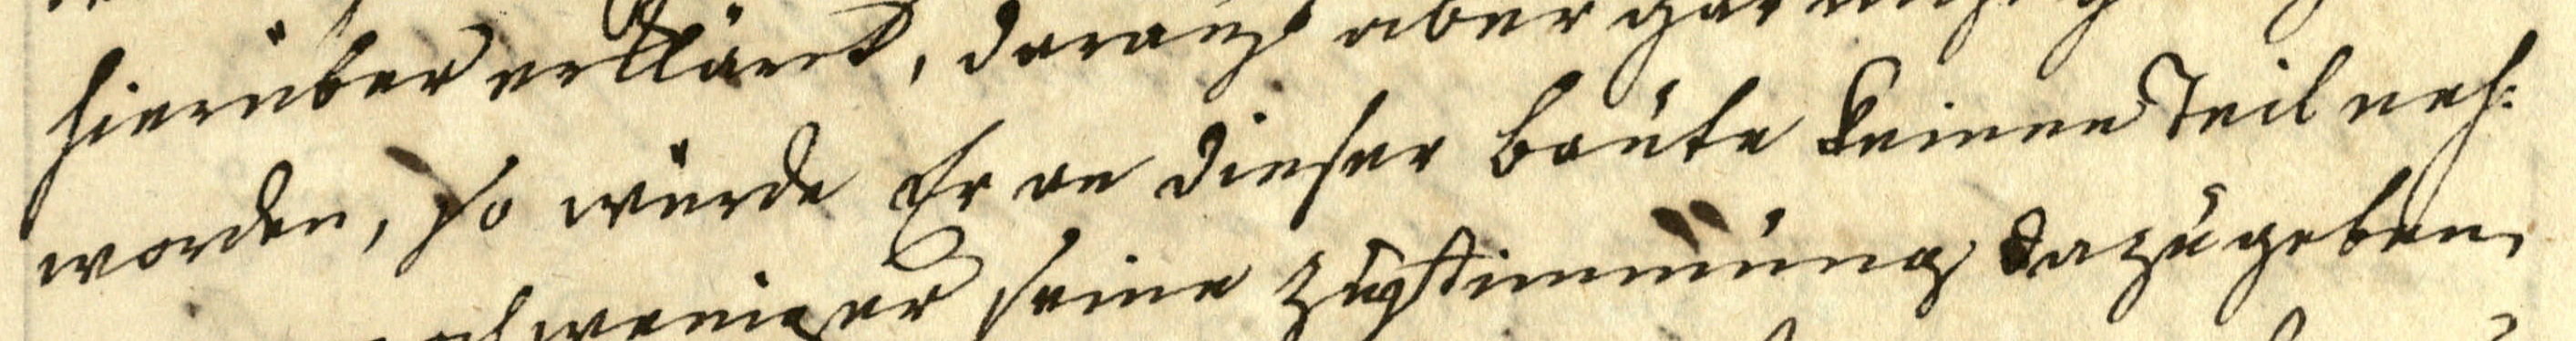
worden, so würde Er an dieser Baute keinen Teil neh¬
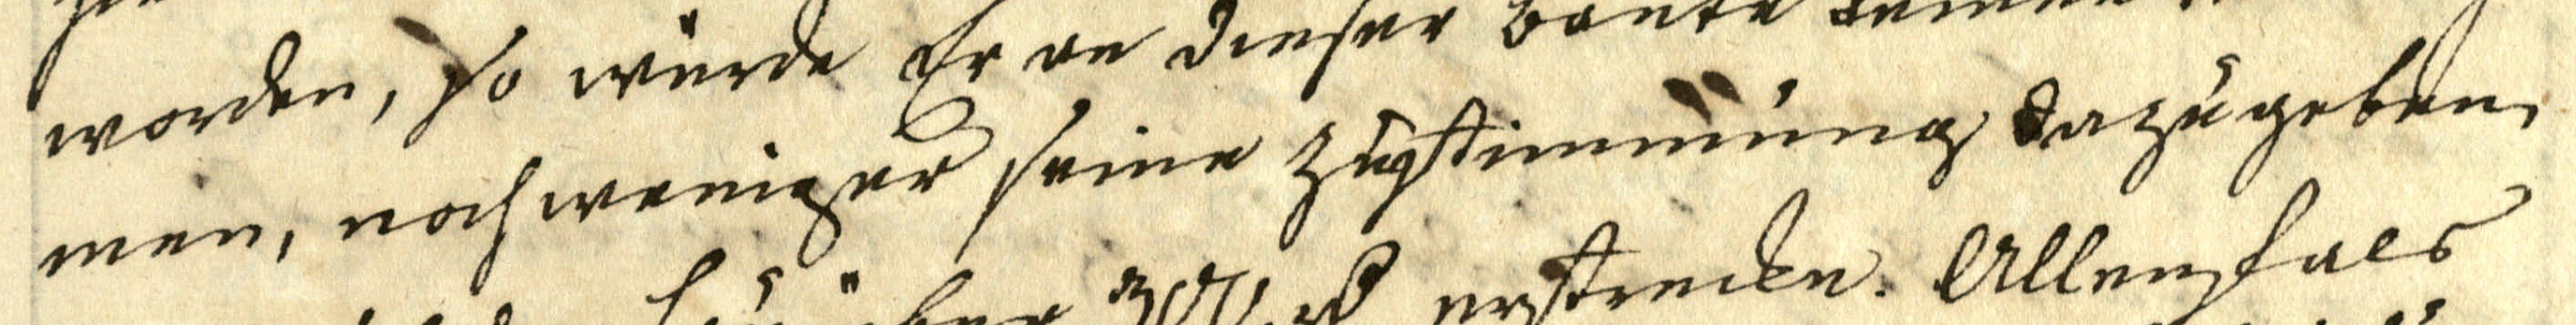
men, noch weniger seine Zustimmung dazu geben,
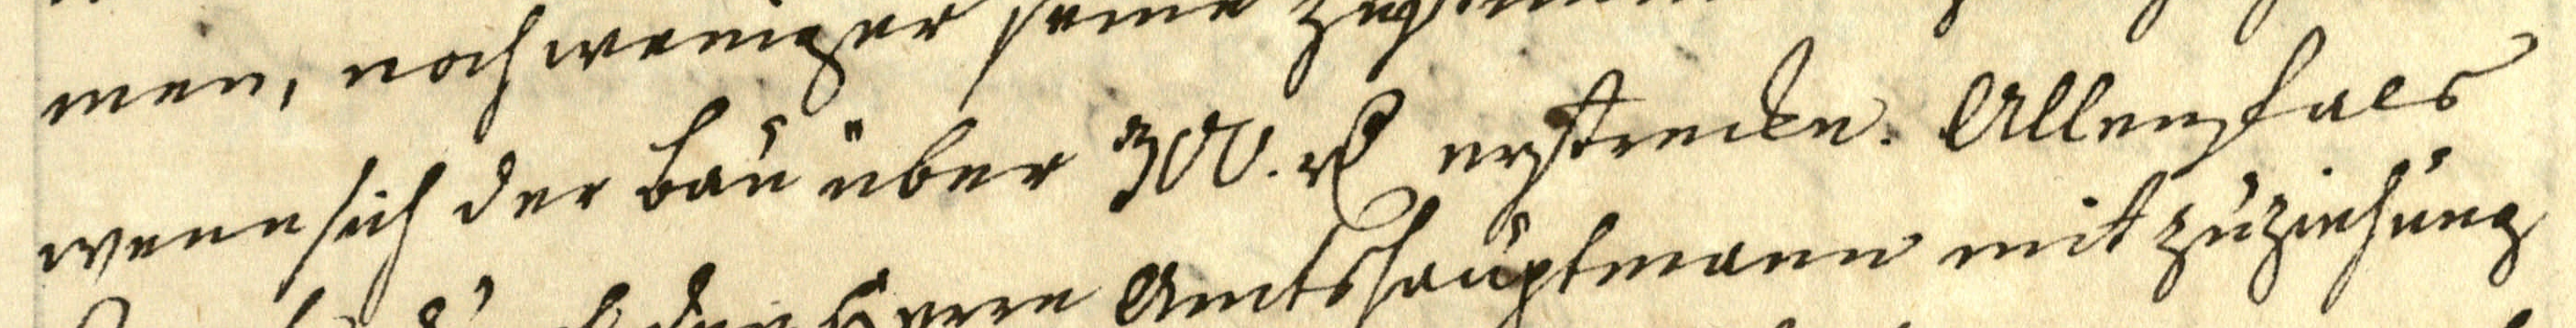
wenn sich der Bau über 300. rtl erstrecke. Allenfals
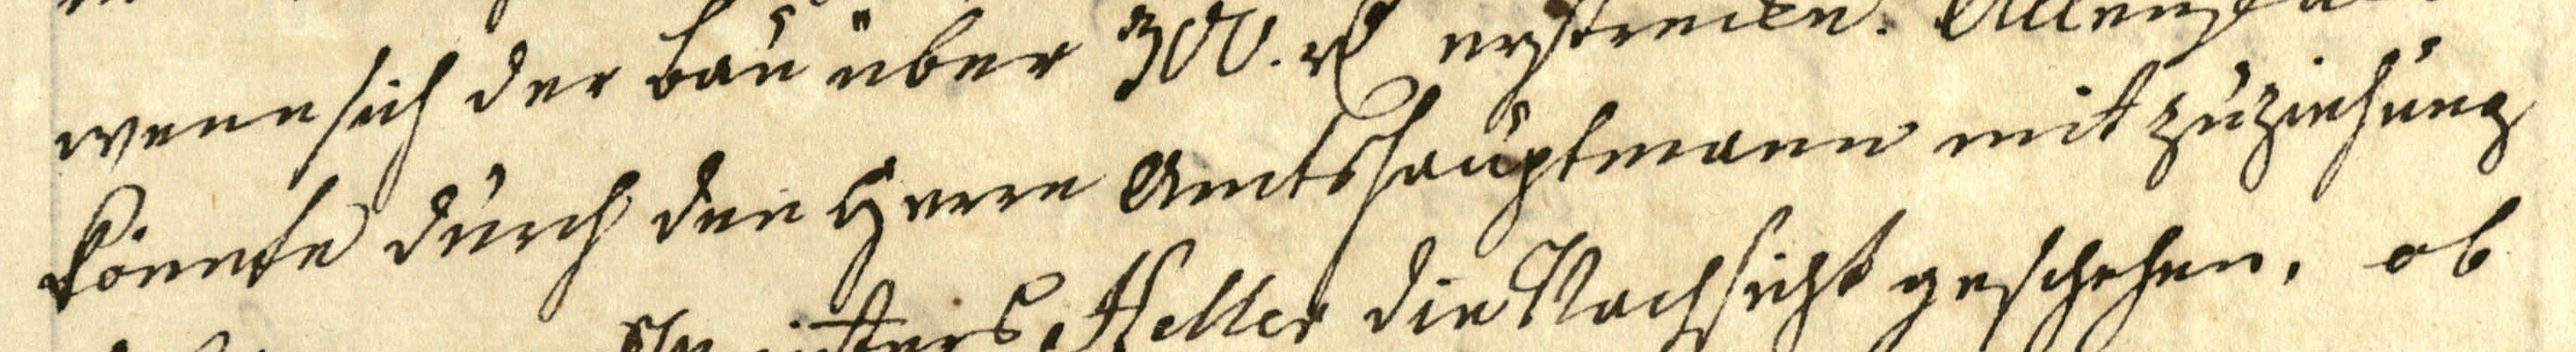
könnte durch den Herrn Amtshauptmann mit Zuziehung
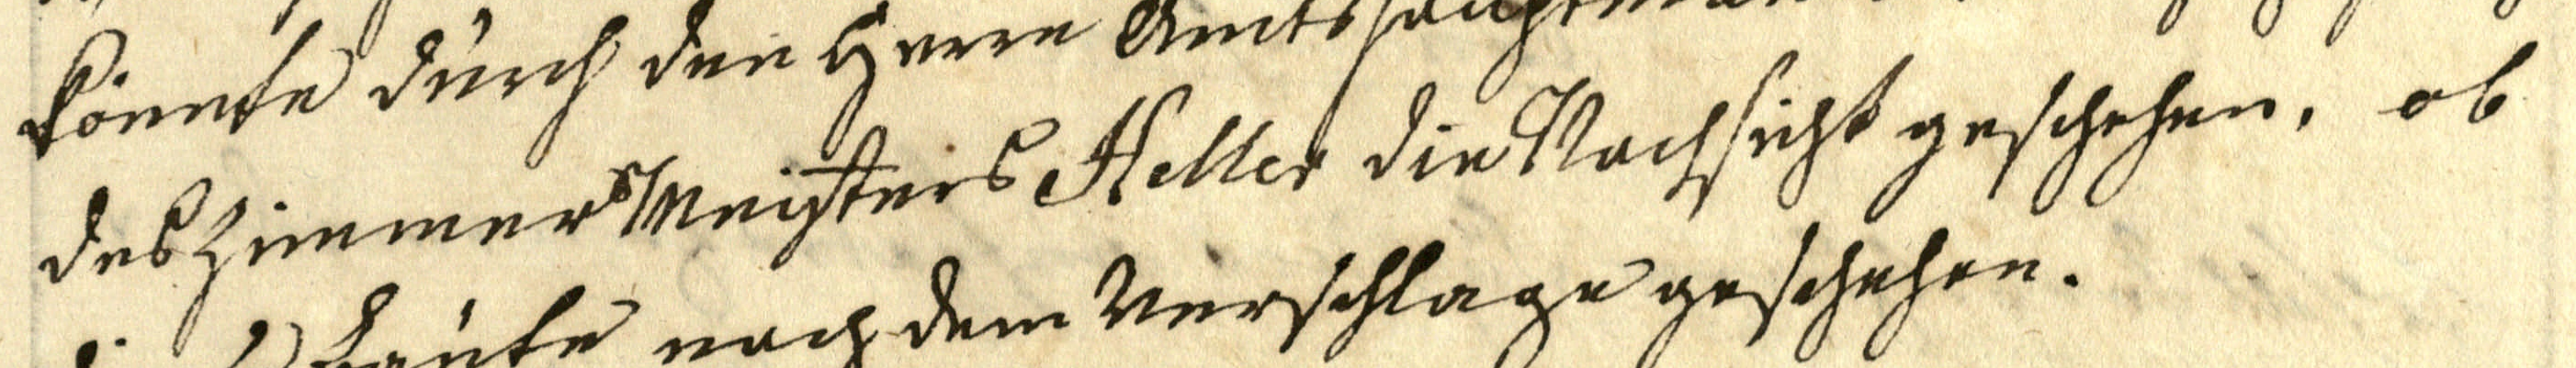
des Zimmer Meisters Heller die Nachsicht geschehen, ob
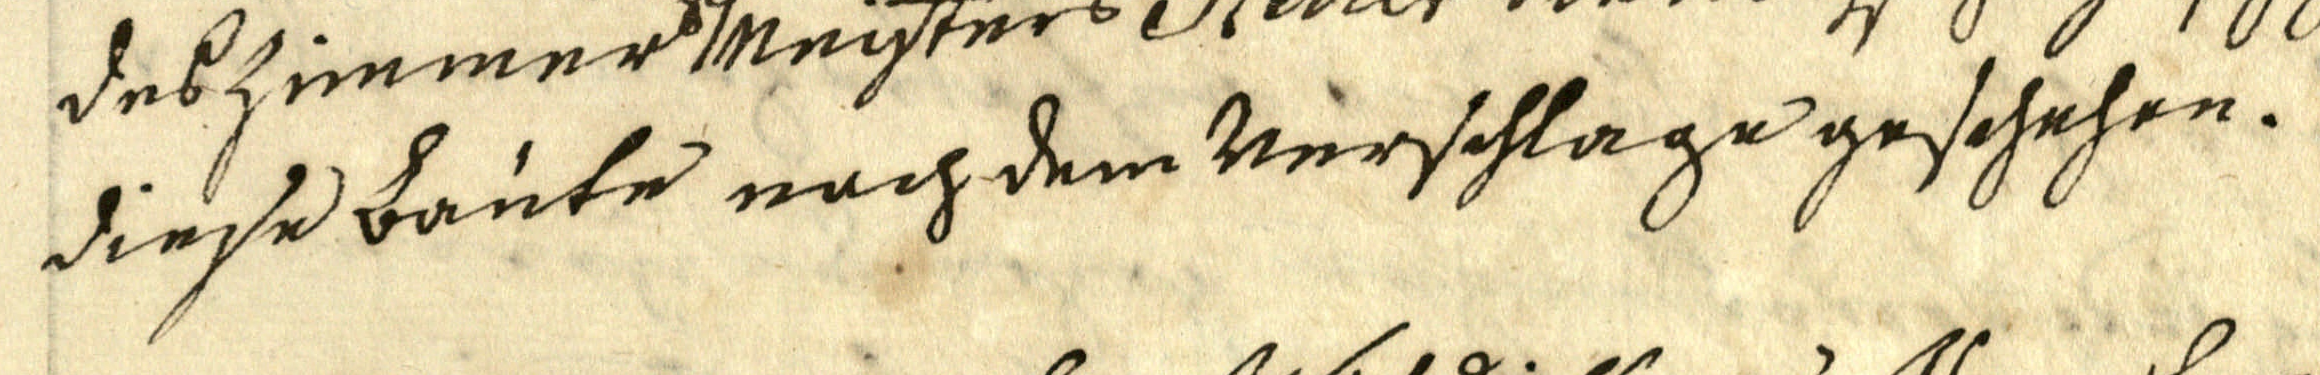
diese Baute nach dem Verschlage geschehen.
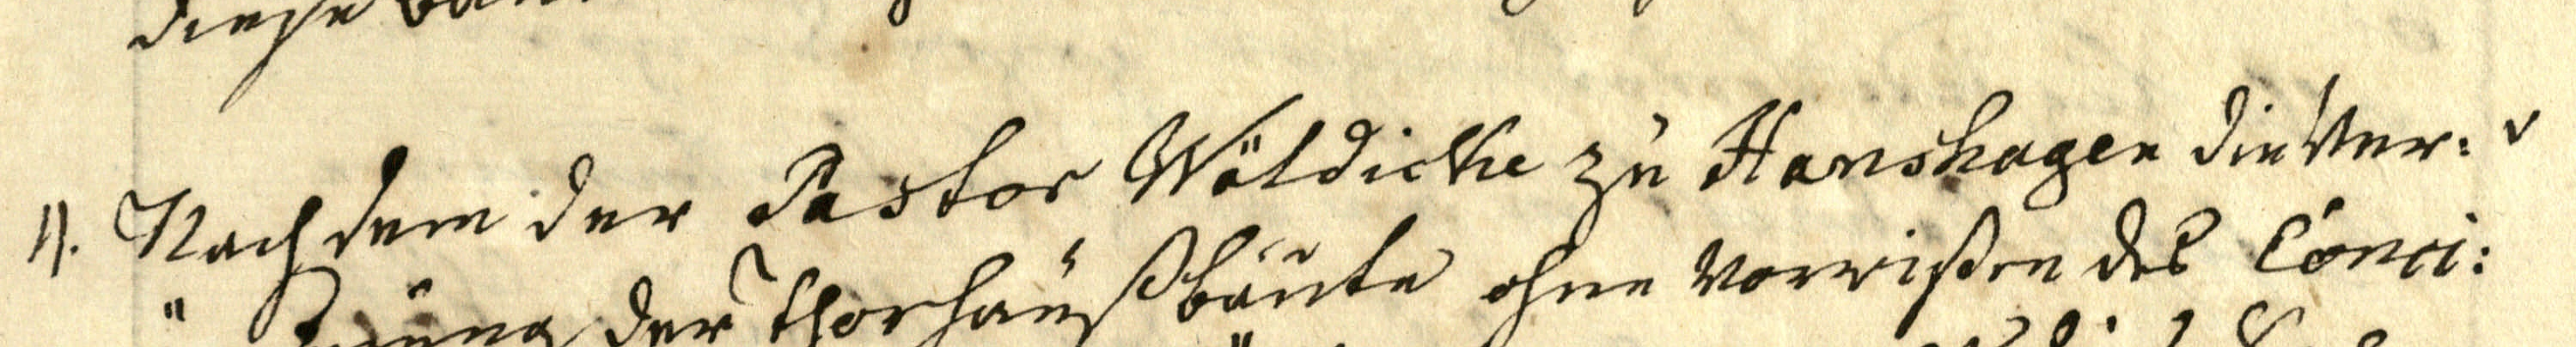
4. Nachdem der Pastor Wöldicke zu Hanshagen die Ver
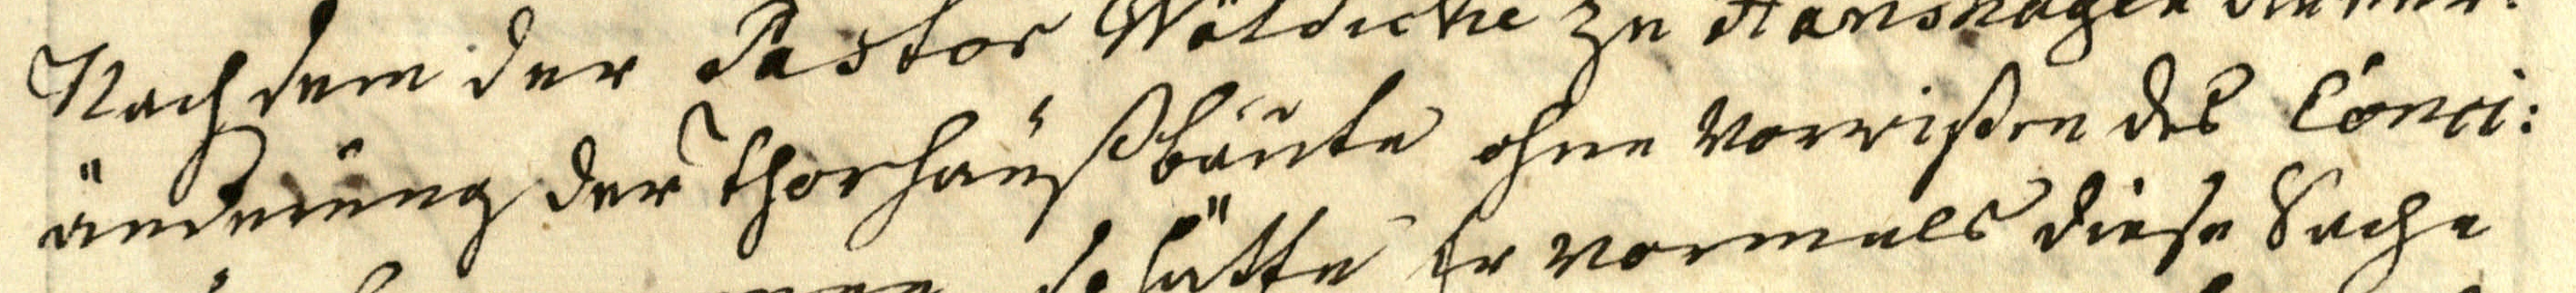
änderung der Thorhaußbaute ohne Vorwißen des Conci¬
